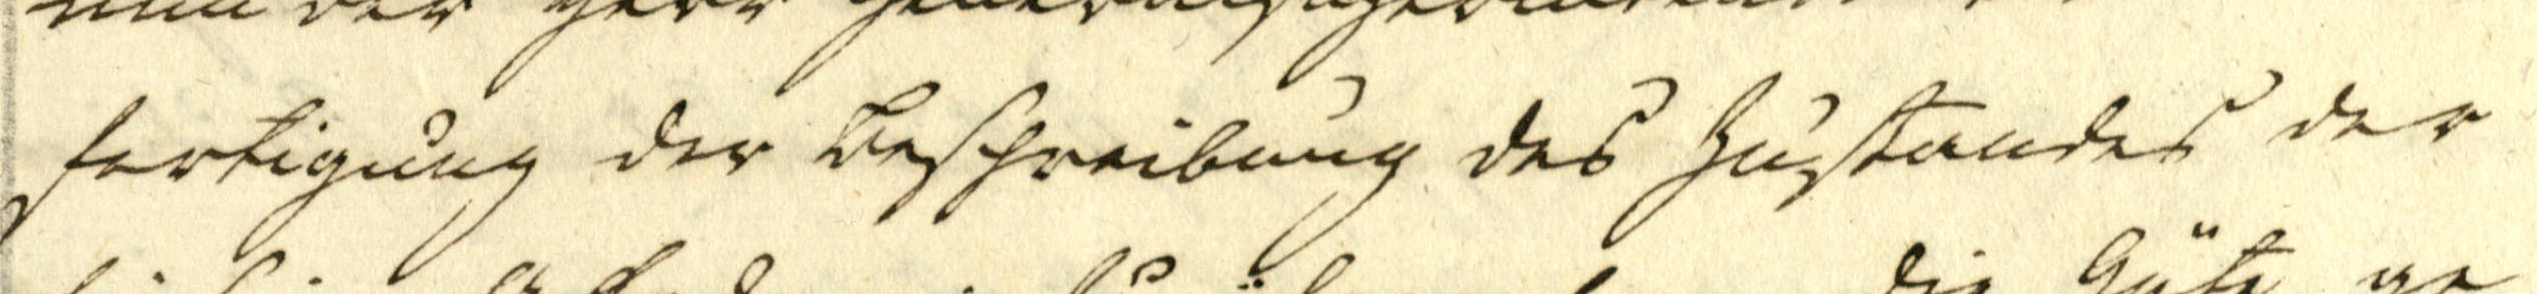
fertigung der Beschreibung des Zustandes der
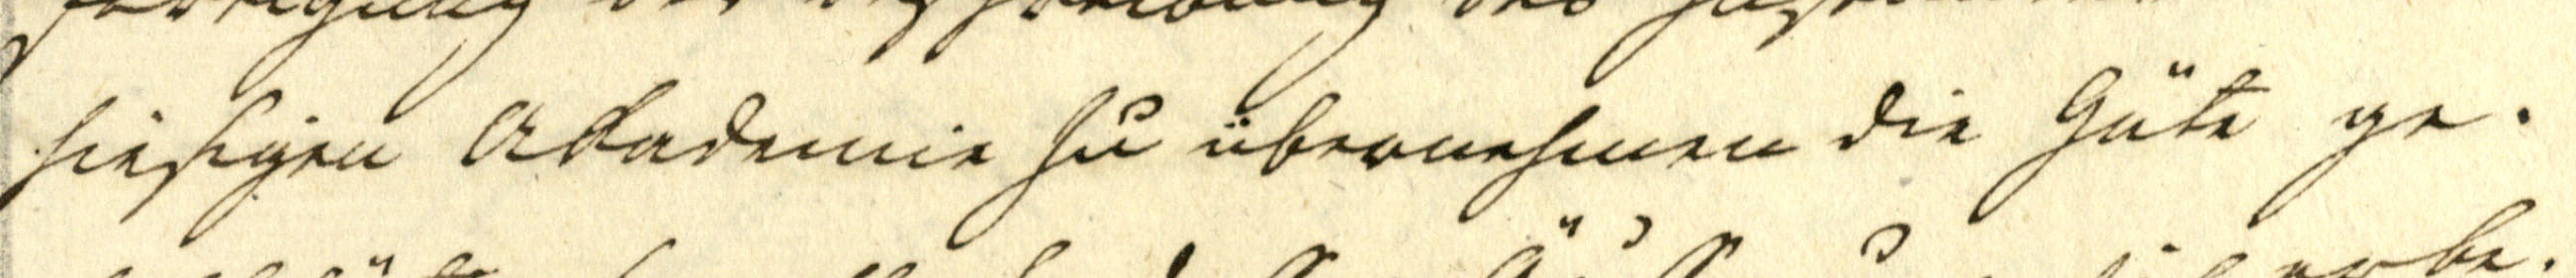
hiesigen Akademie zu übernehmen die Güte ge¬
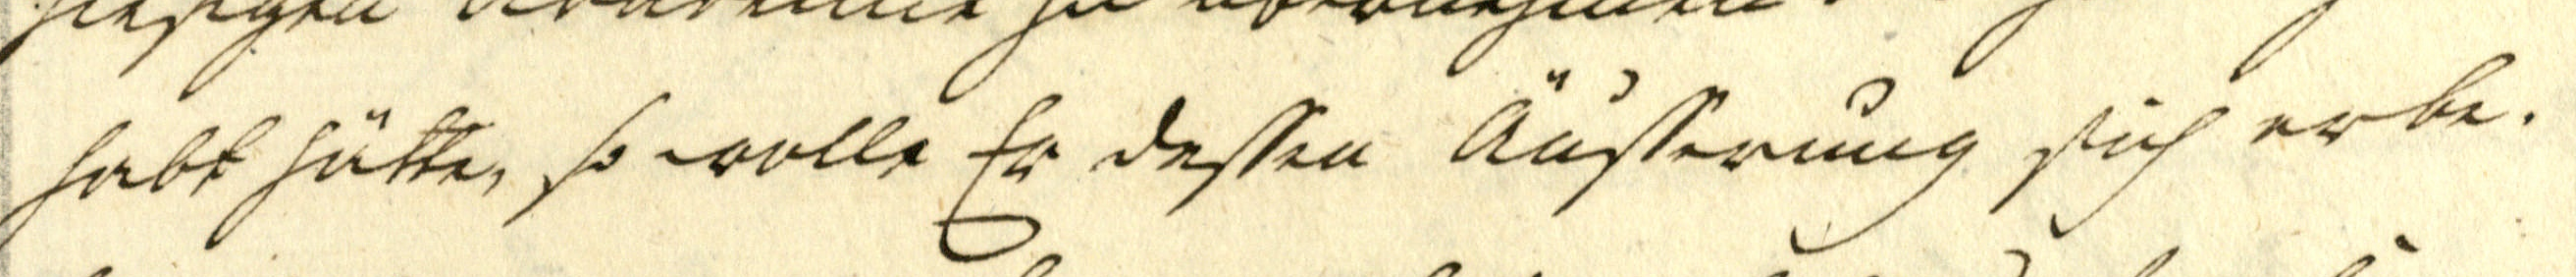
habt hätte, so wolle Er dessen Äusserung sich erbe¬
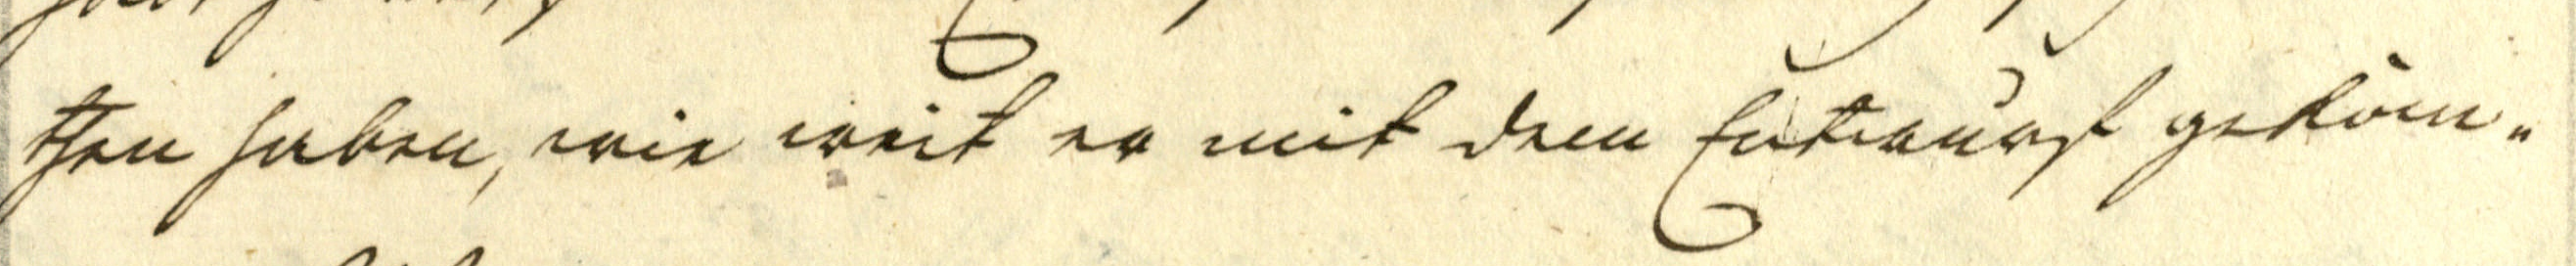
then haben, wie weit er mit dem Entwurf gekom¬
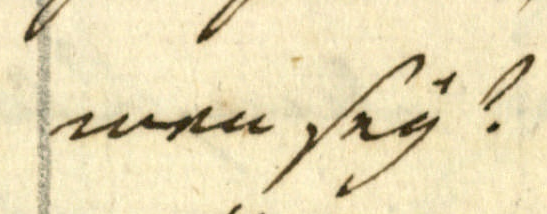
nen seÿ?
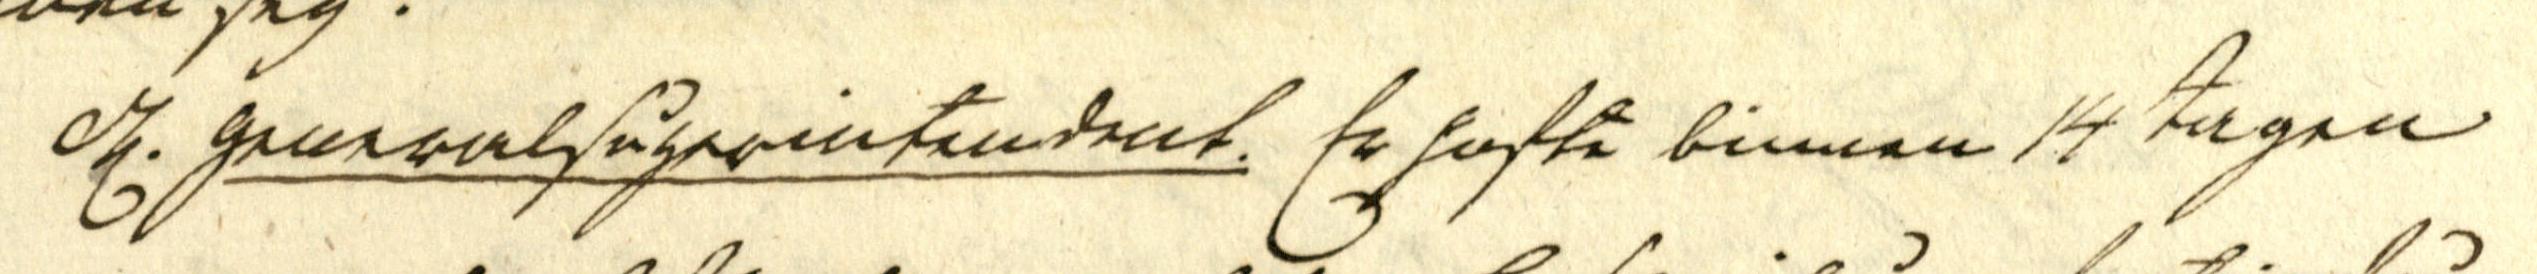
dh. Generalsuperintendent. Er hofte binnen 14 Tagen
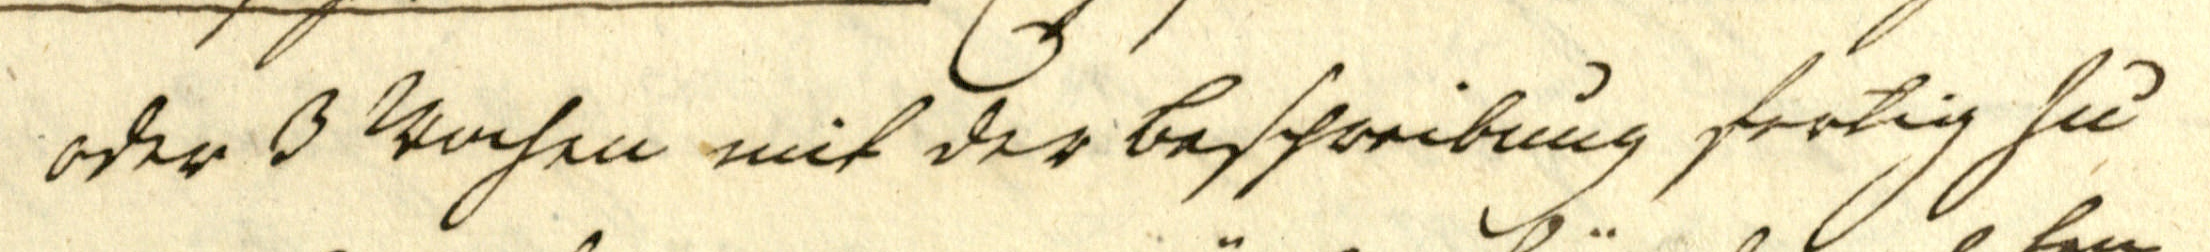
oder 3 Wochen mit der Beschreibung fertig zu
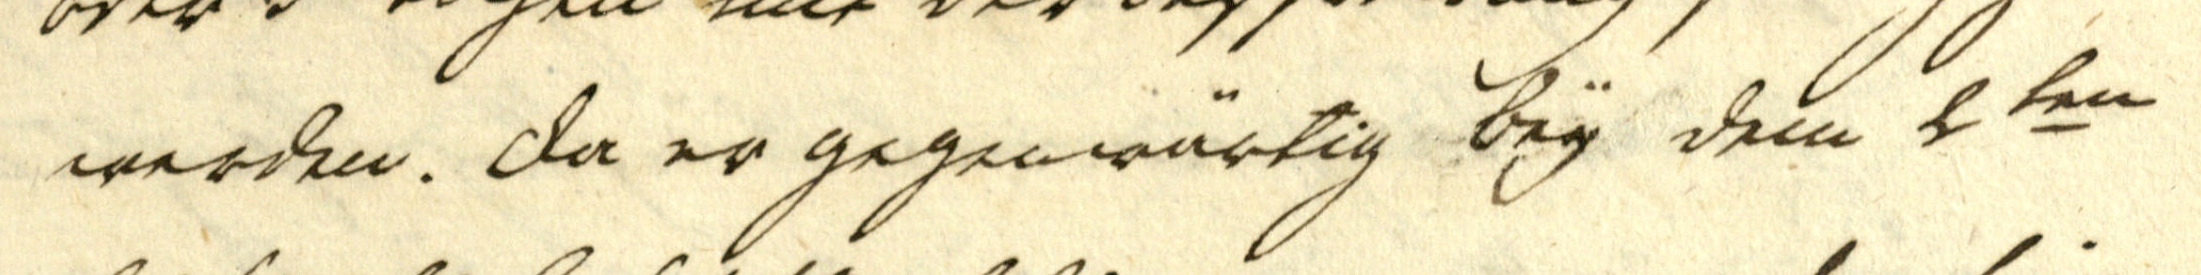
werden. Da er gegenwärtig beÿ dem 2 ten
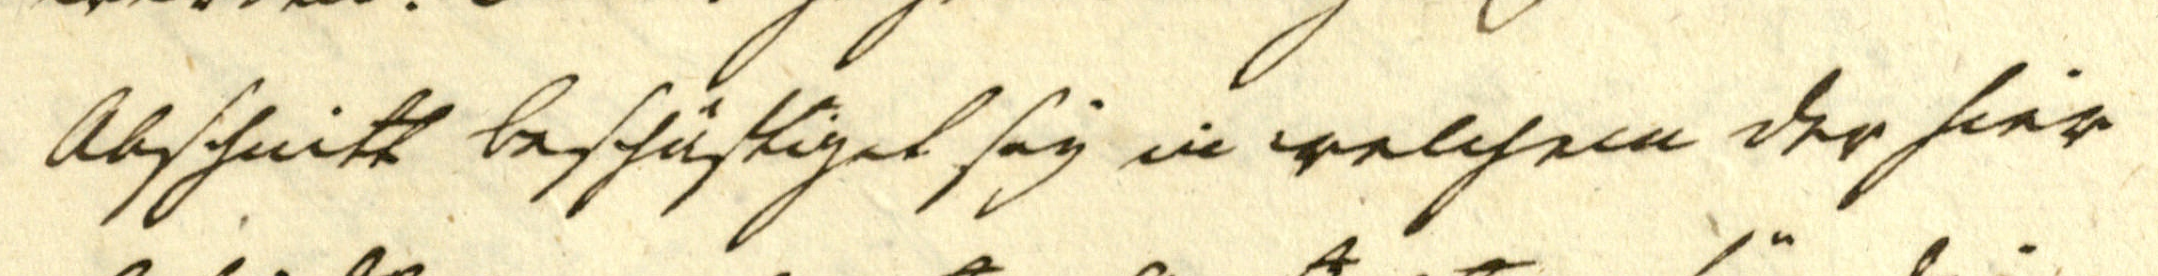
Abschitt beschäftiget seÿ in welchem der hier
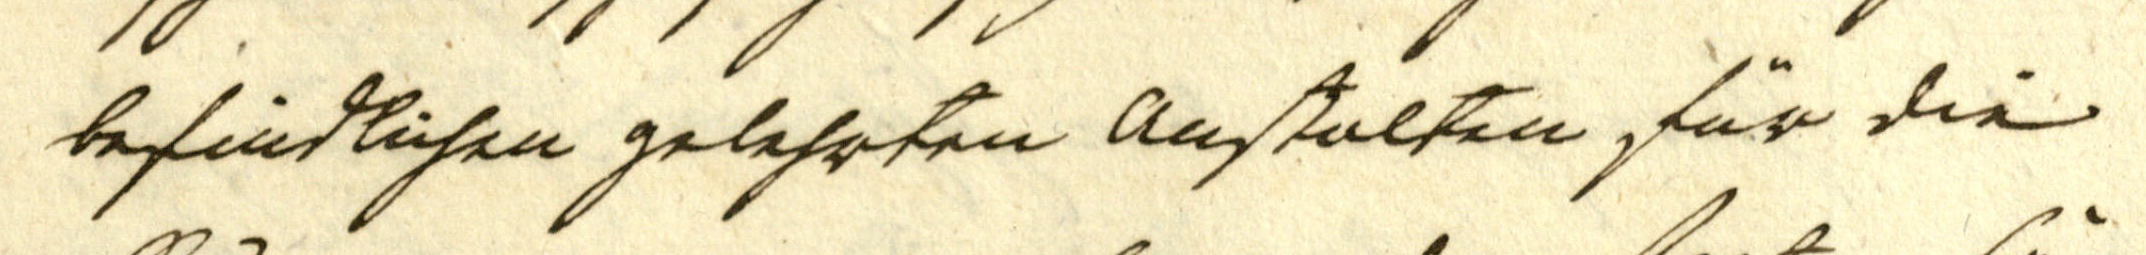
befindlichen gelehrten Anstalten für die
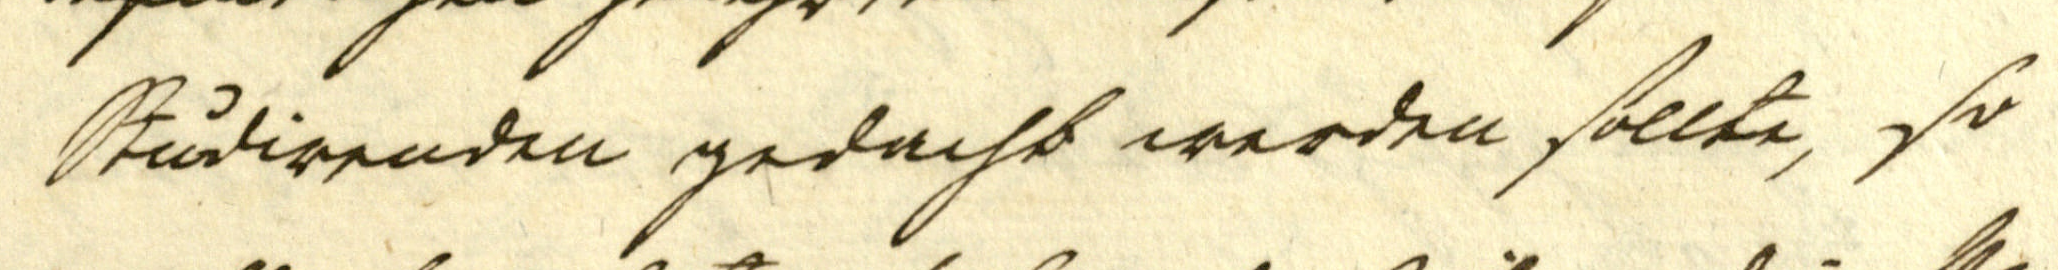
Studirenden gedacht werden sollte, so
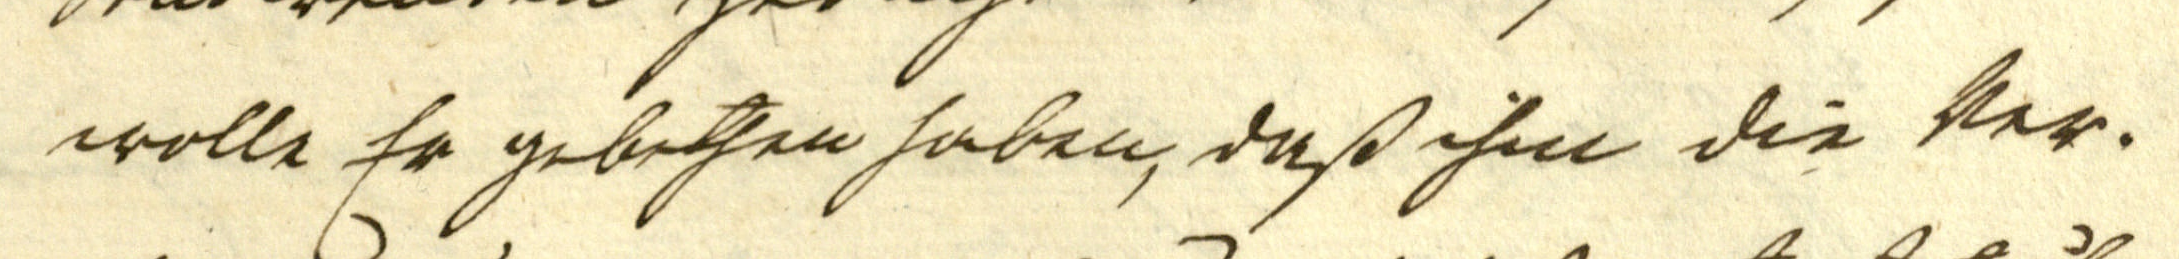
wolle Er gebethen haben, daß ihm die Ver¬
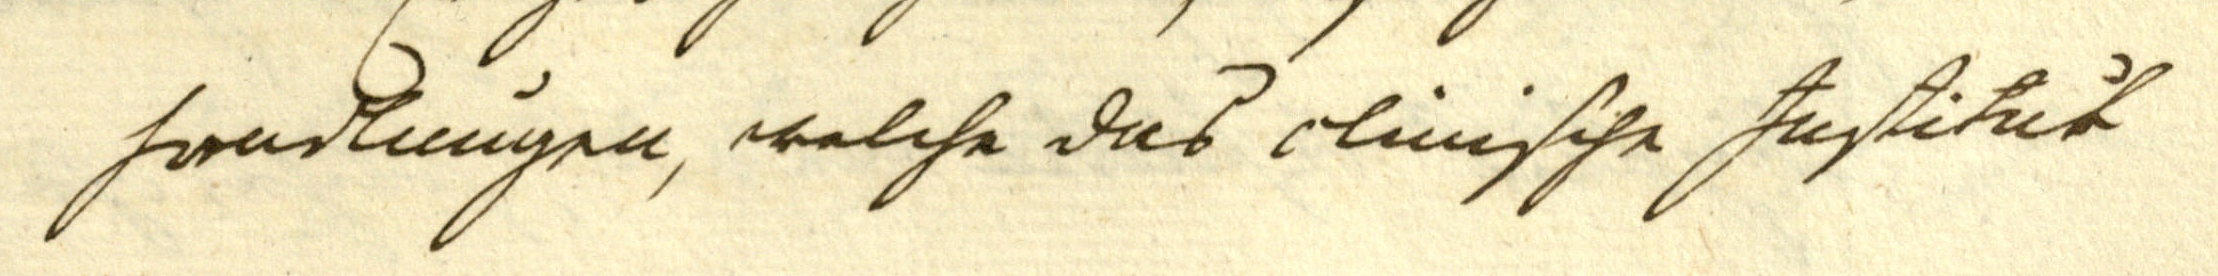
handlungen, welche das clinische Institut
